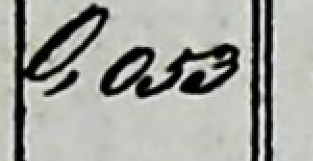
0,053
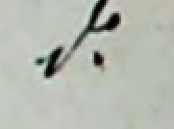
do
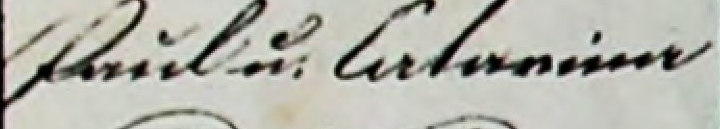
Paul u. Catarina
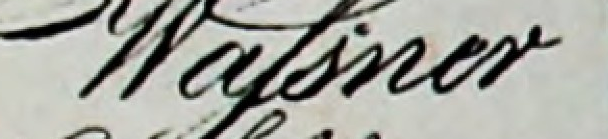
Wassner
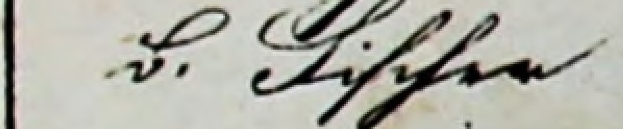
v. Sischer
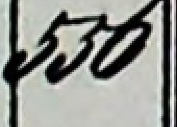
556
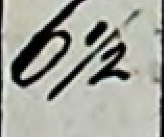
6 1/2
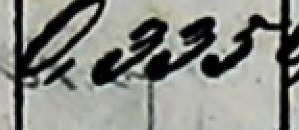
0,335
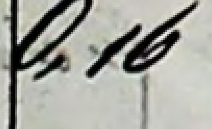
0,16
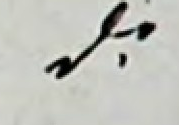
do
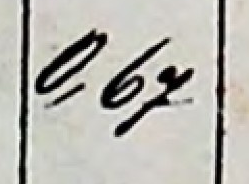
0,67
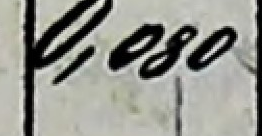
0,080
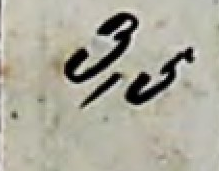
3,5
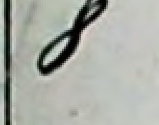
8
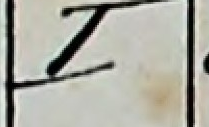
I
